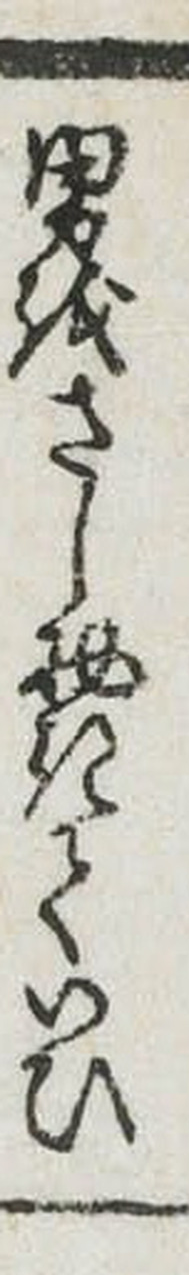男をさしおきていひ
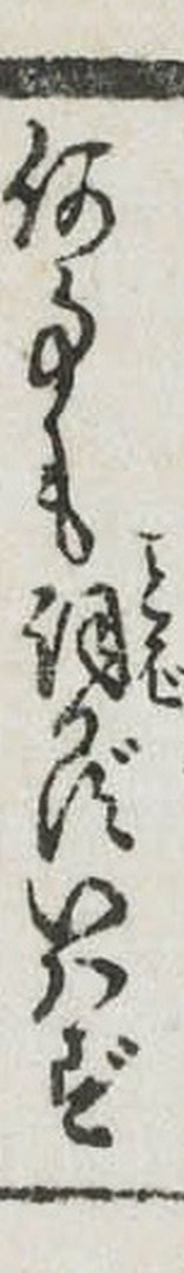何事も詞かずいはず
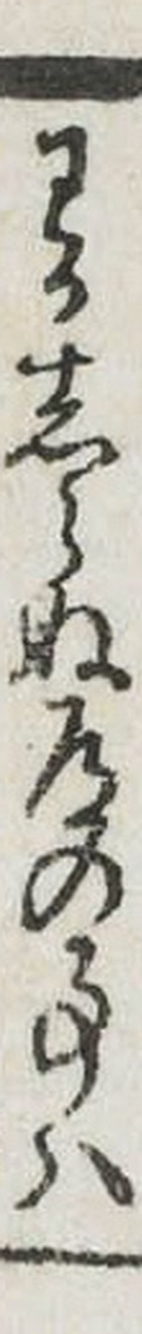わかしらぬ道の事は
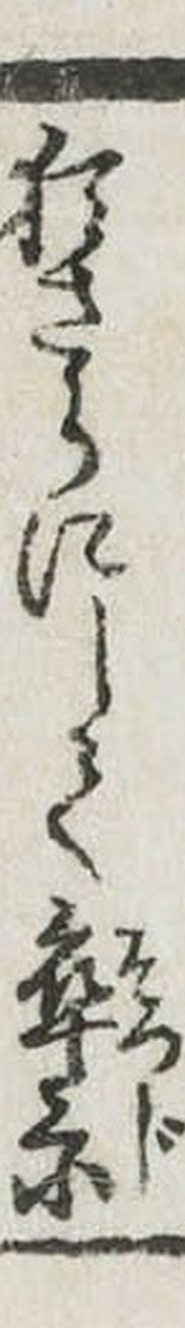猶さらにして卒爾
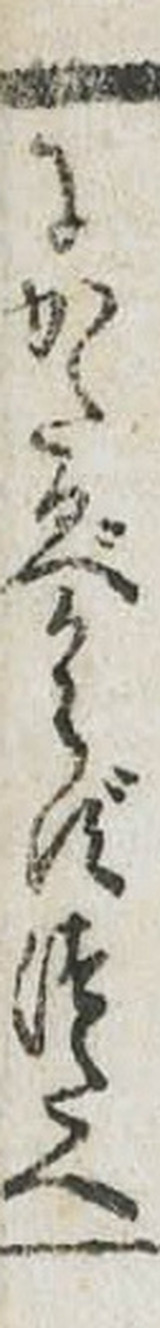にかたるべからずつたへ
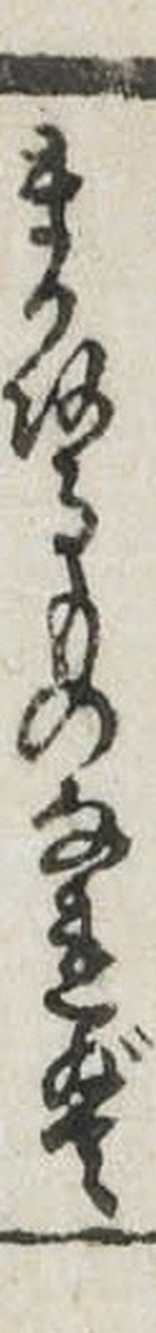まりあるものなれば
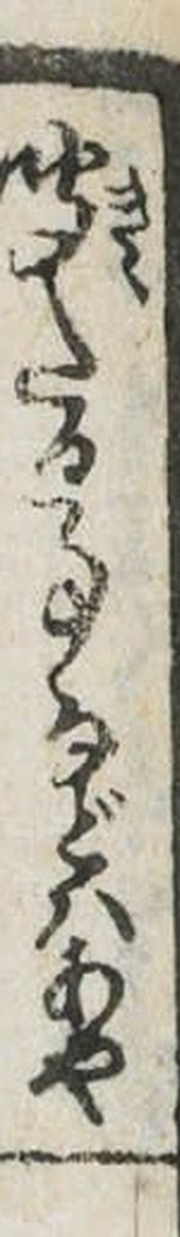聞たる事などはあや
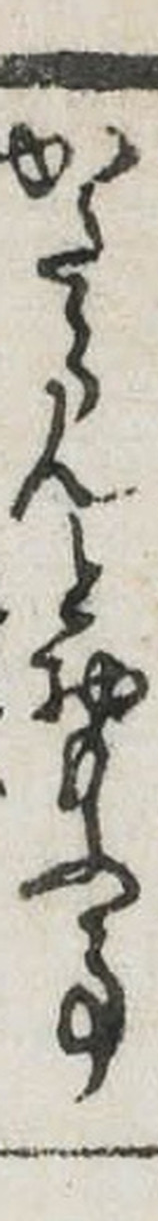かたらんとおもふ事
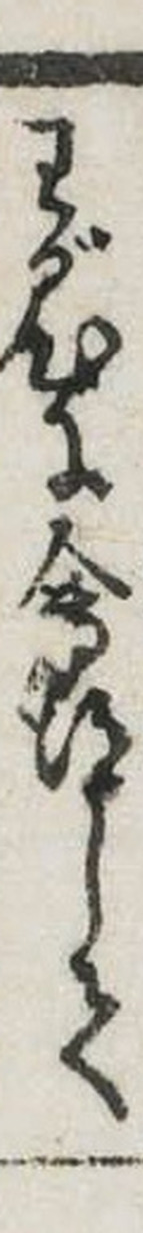わが心に会得して
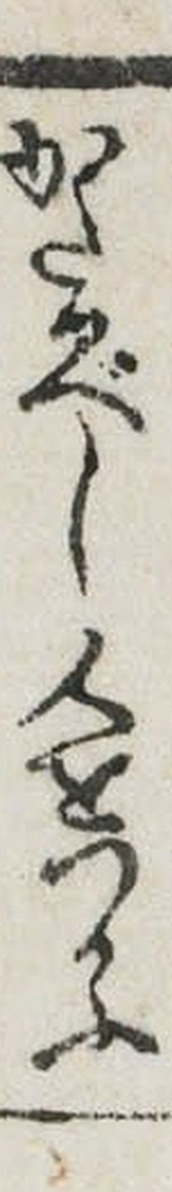かたるべし人をつかふ
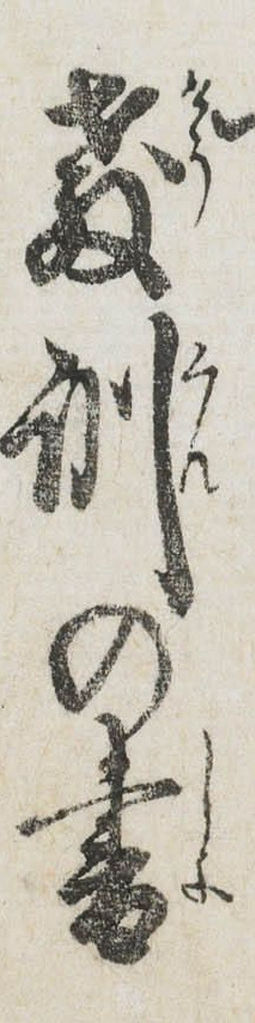教訓の書
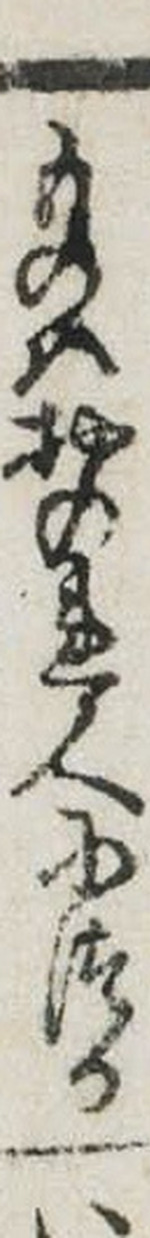ものはおのれ人につか
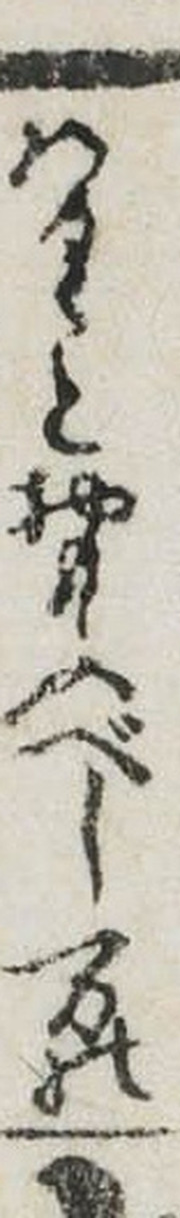はるゝとおもふべし万の
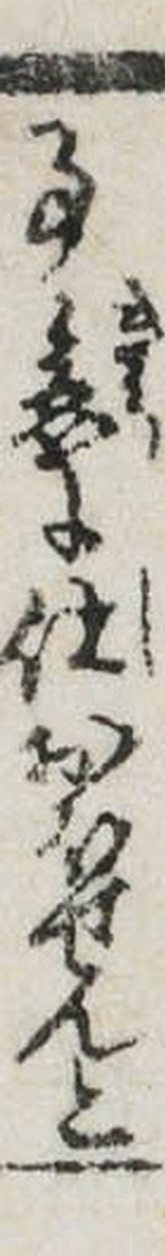事急に仕おほせんと
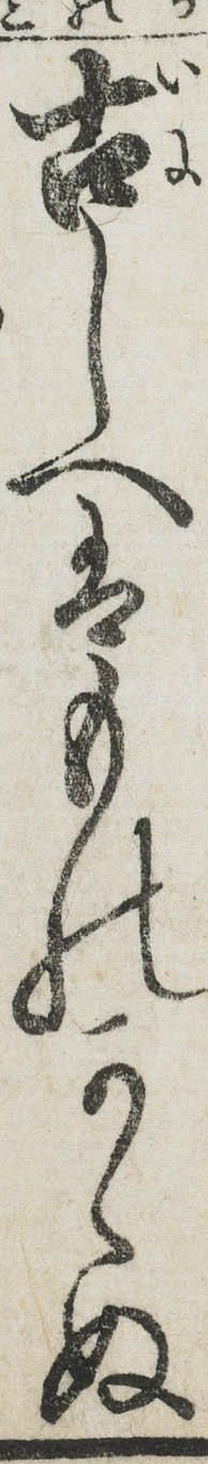古しへはものかゝぬ
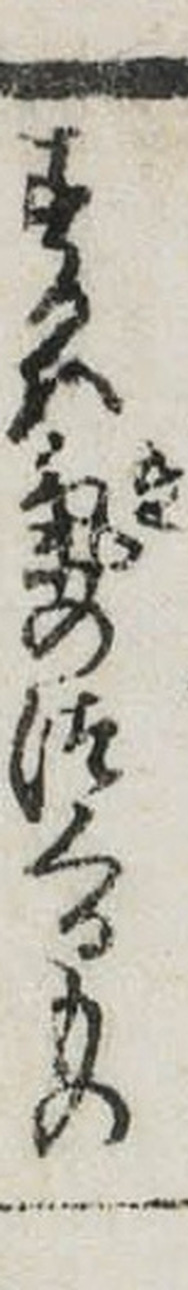するは気のつくるもの
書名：頭書萬用婦人手紙之文言
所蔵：東京学芸大学教育コンテンツアーカイブ
